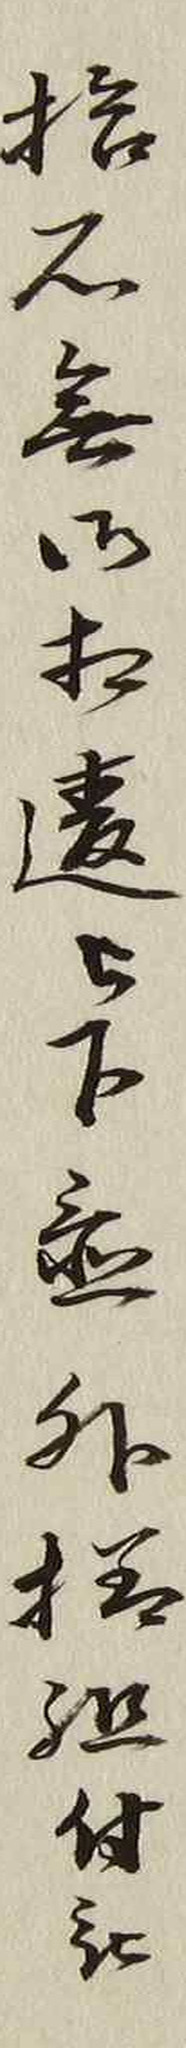拾石無御相違被下置外様組付被
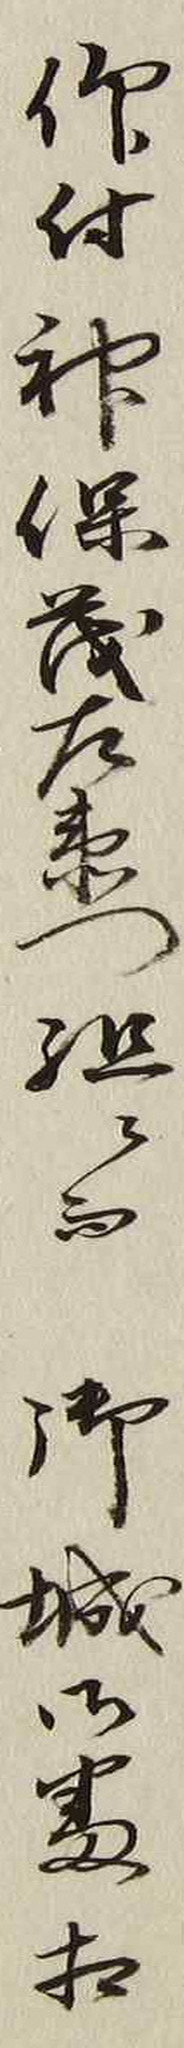仰付神保茂左衛門組ニ而御城御番相
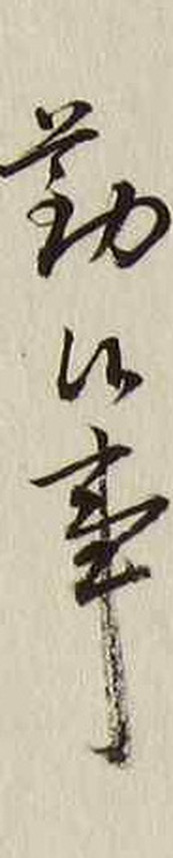勤候事
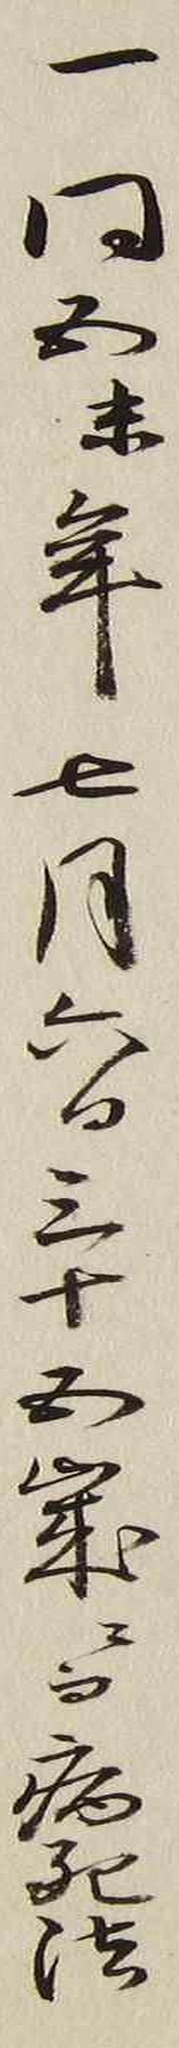一同五未年七月六日三十五歳ニ而病死法
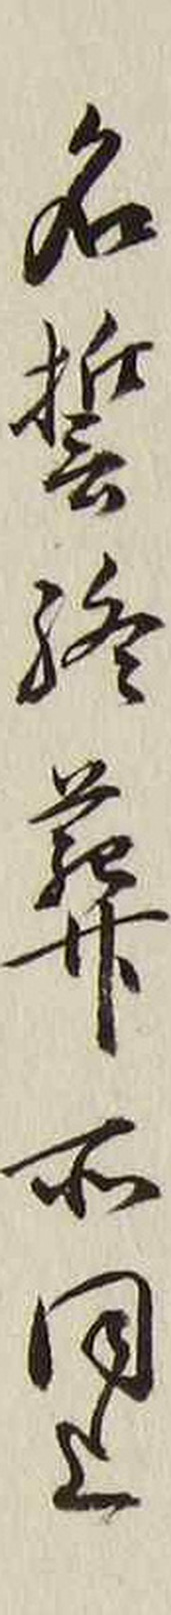名誓終葬所同上

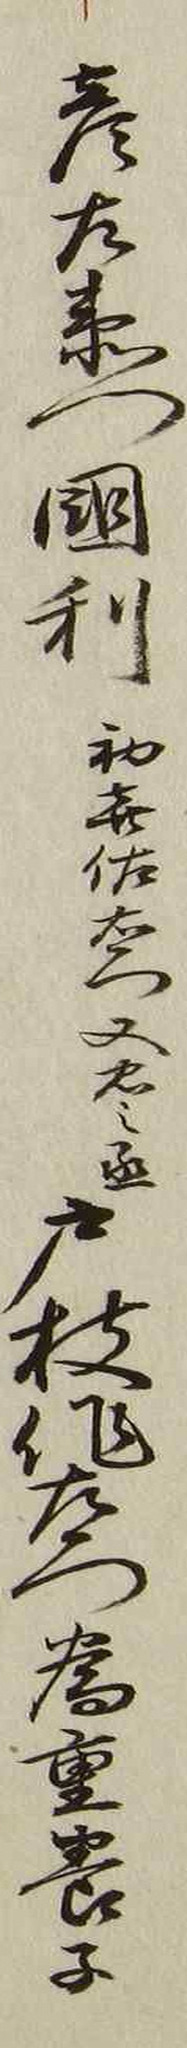彦左衛門国利初喜佐右衛門又忠之丞戸枝作左衛門為重養子
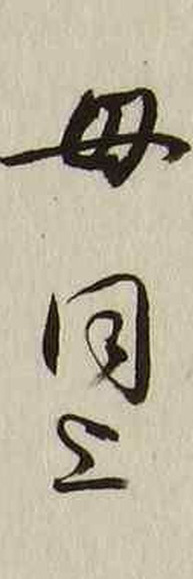母同上
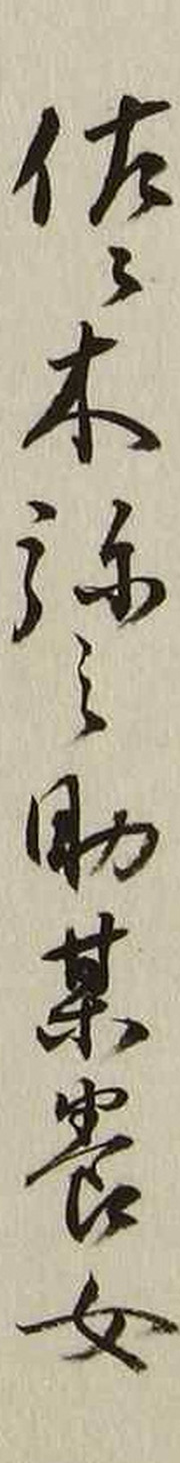女佐々木弥之助某養女
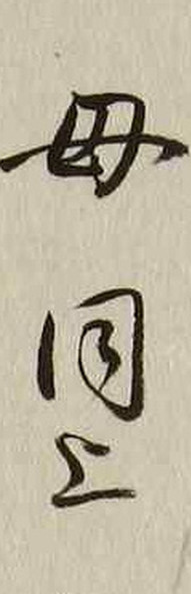母同上
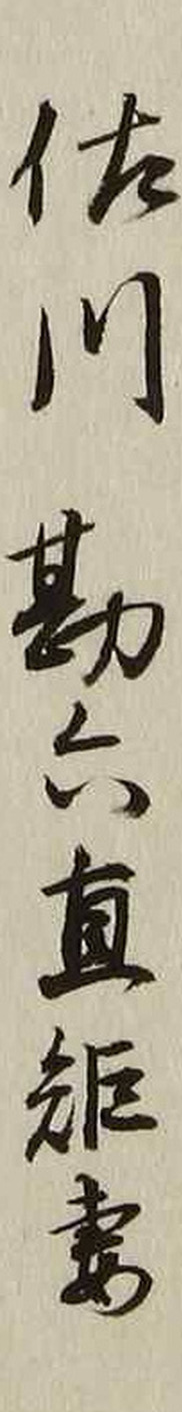佐川勘六直矩妻
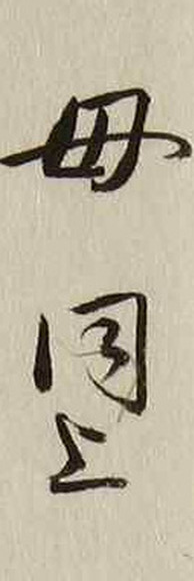母同上
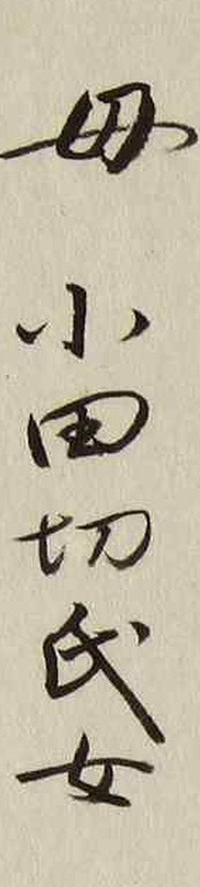母小田切氏女
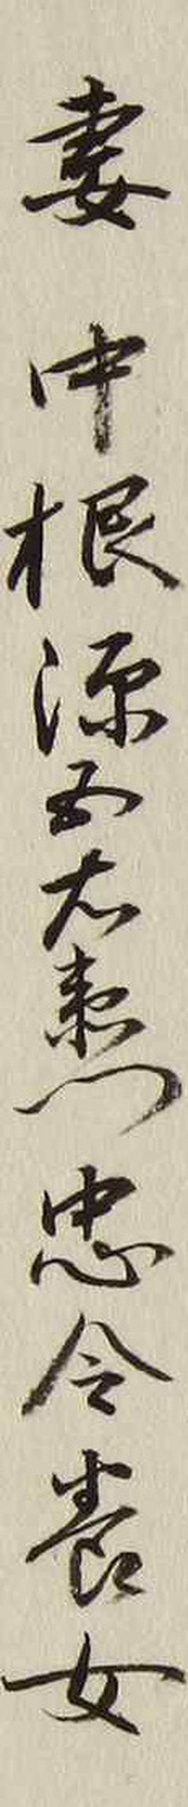妻中根源五右衛門忠令養女
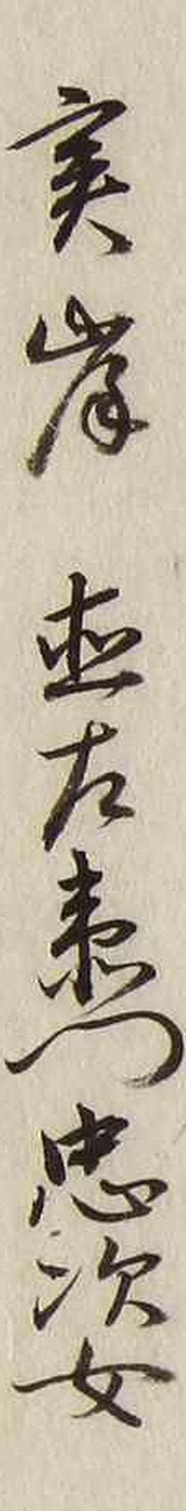実岸直左衛門忠次女

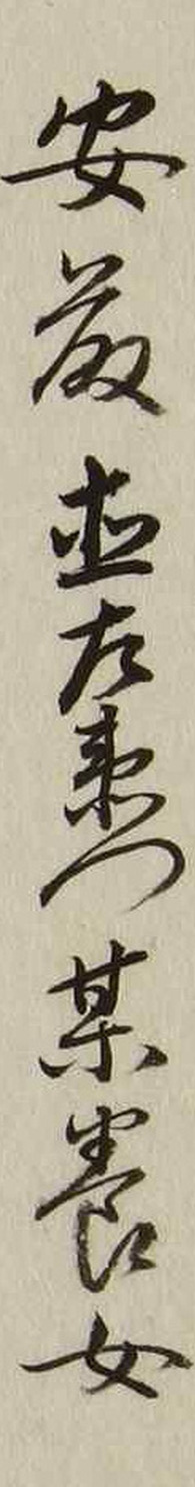安藤直左衛門某養女
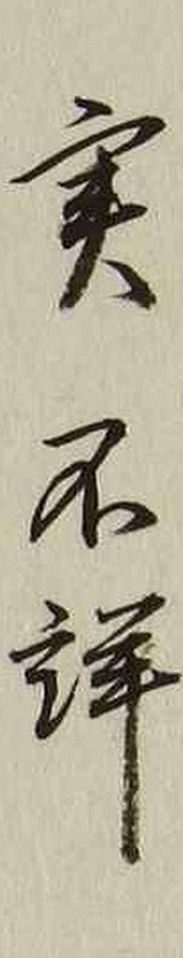実不詳
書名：諸士系譜　巻之160　な之部2
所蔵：会津若松市立会津図書館
